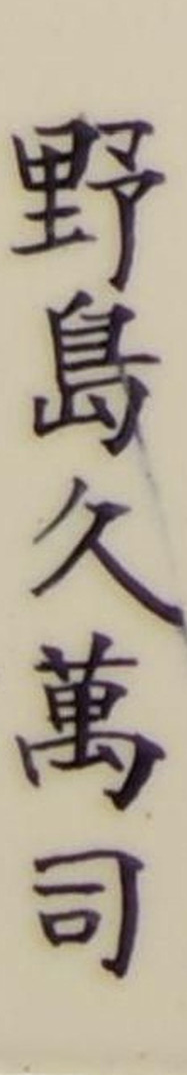野島久萬司
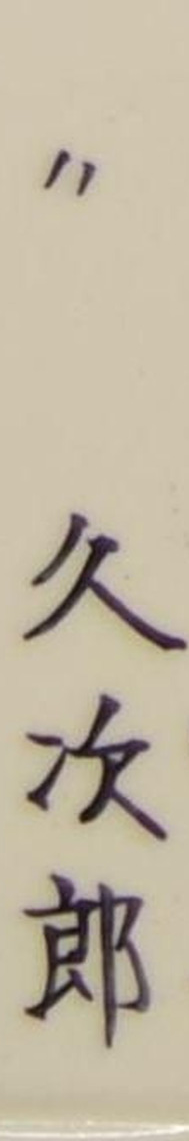久次郎
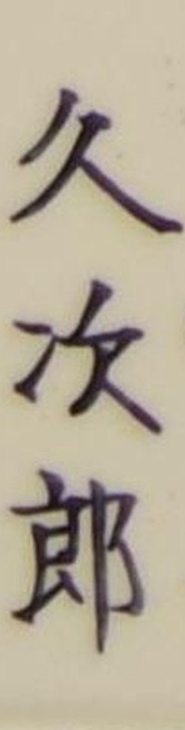久次郎

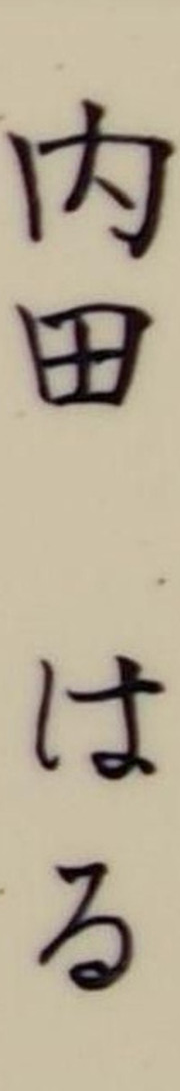内田はる
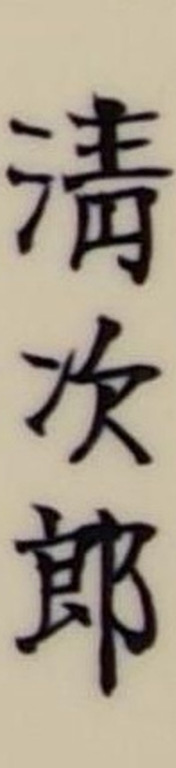清次郎
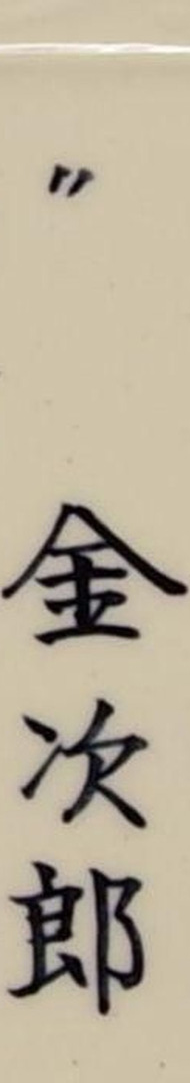金次郎
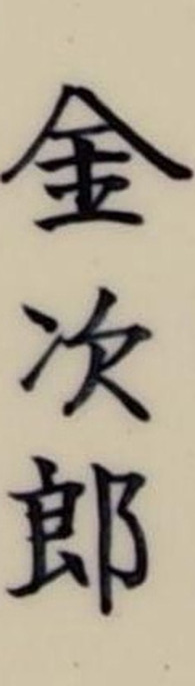金次郎
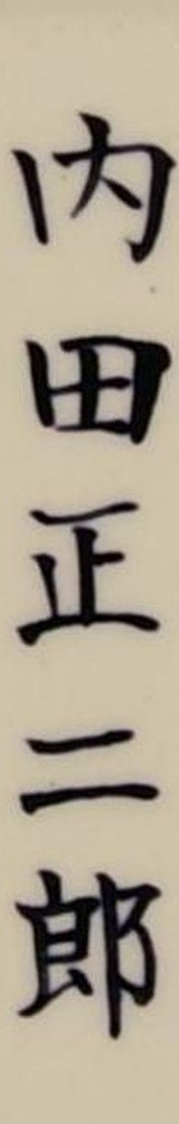内田正二郎
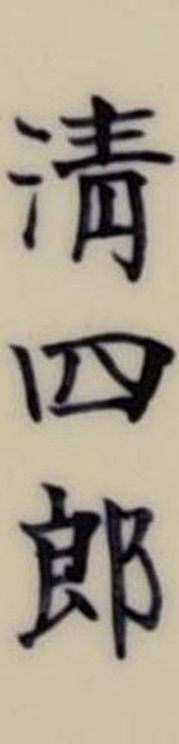清四郎
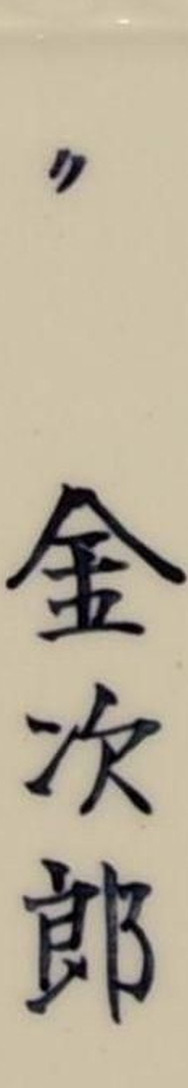金次郎
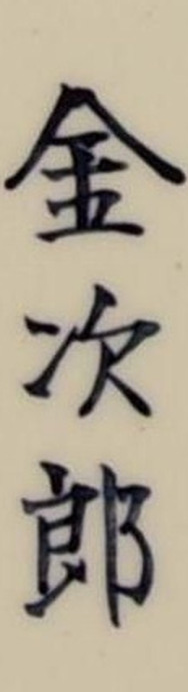金次郎
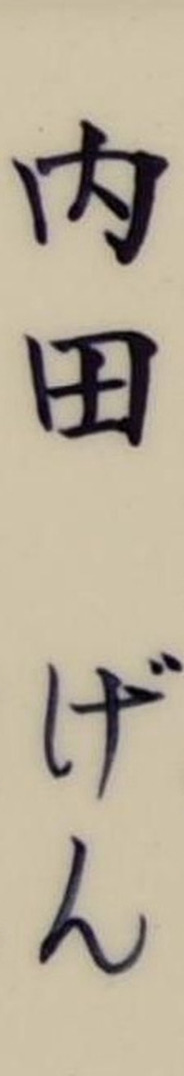内田げん
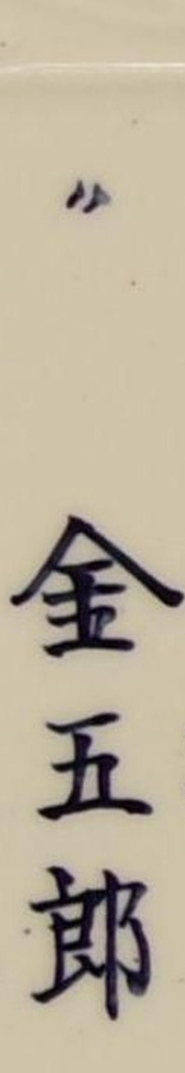金五郎
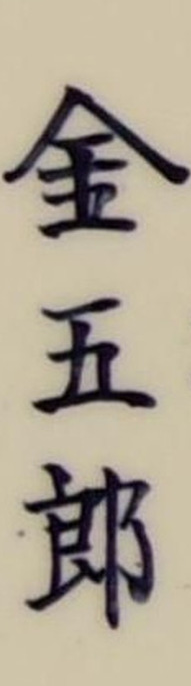金五郎
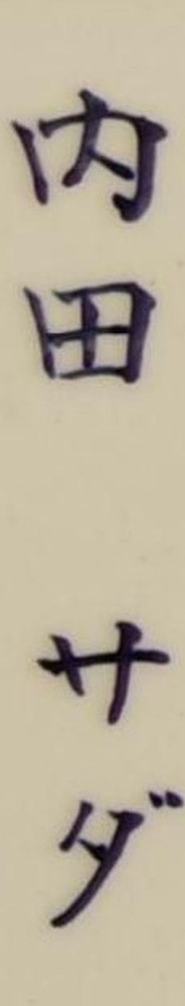内田サダ

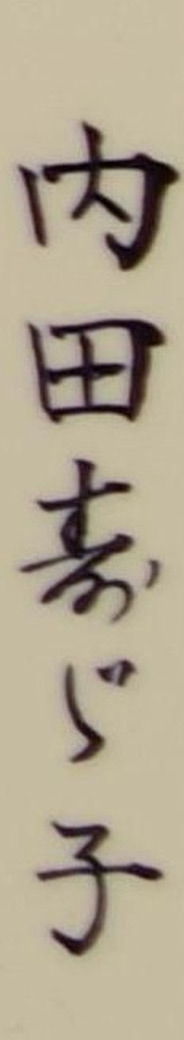内田すず子
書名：A~D
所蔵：koyasan kongobuji
